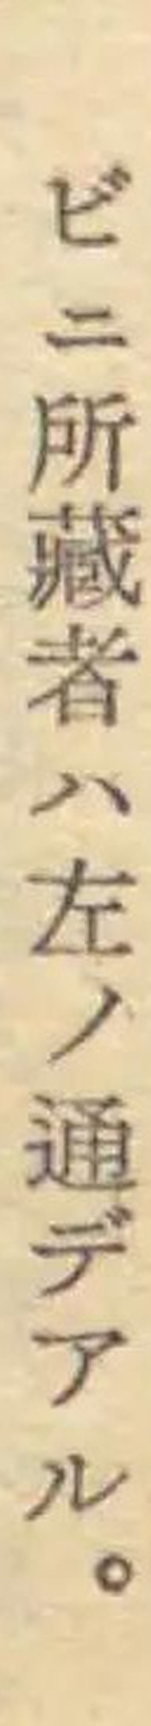ビニ所蔵者ハ左ノ通デアル。
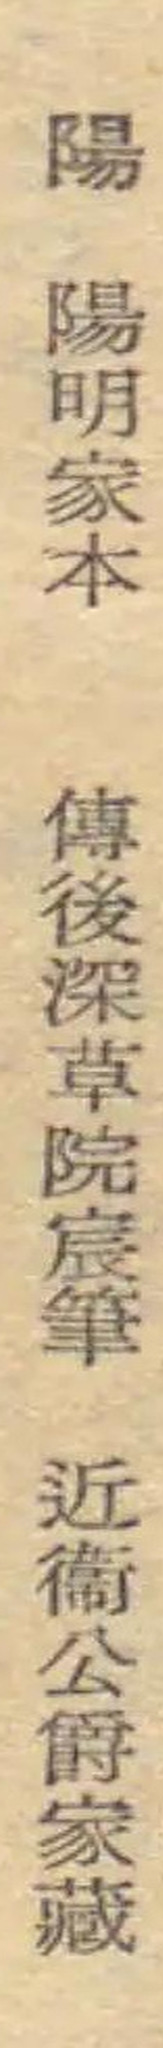陽陽明家本伝後深草院宸筆近衛公爵家蔵
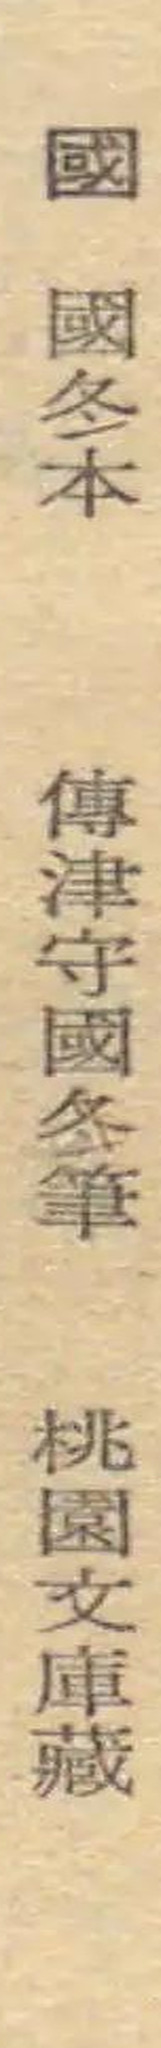国国冬本伝津守国冬筆桃園文庫蔵
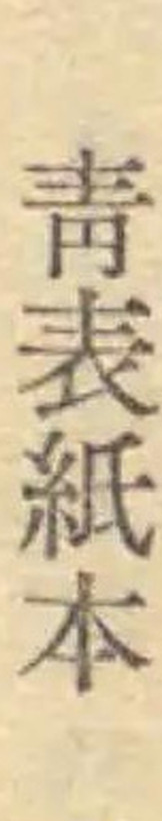青表紙本
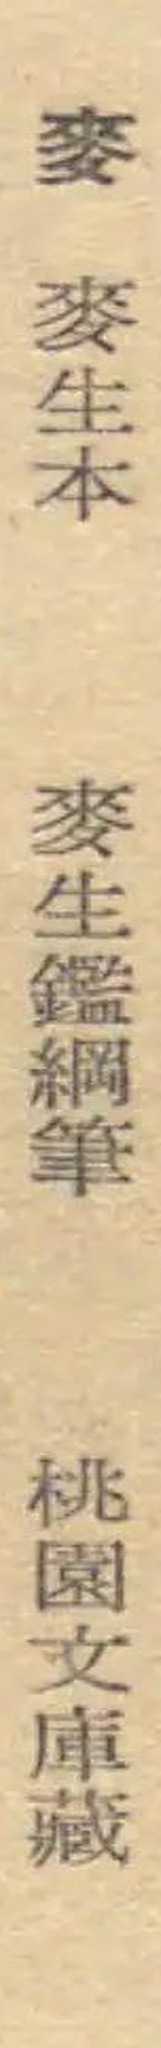麦麦生本麦生鑑綱筆桃園文庫蔵
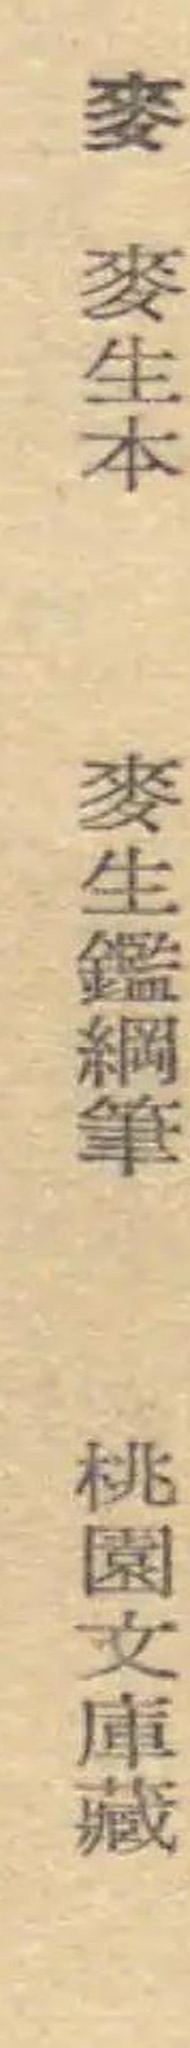麦麦生本麦生鑑綱筆桃園文庫蔵
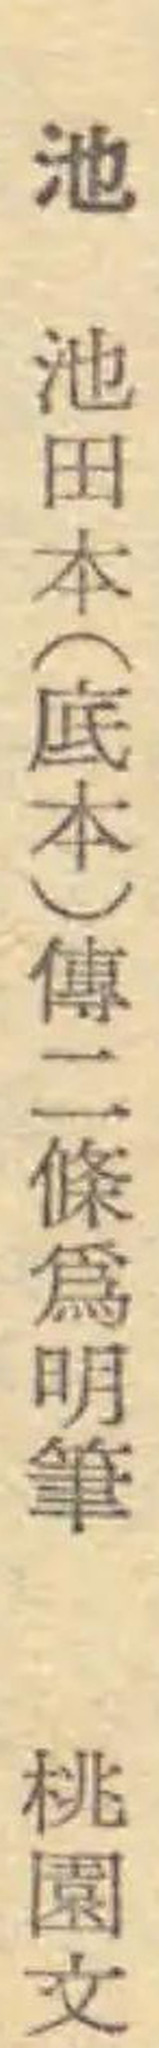池池田本(底本)伝二条為明筆桃園文庫蔵
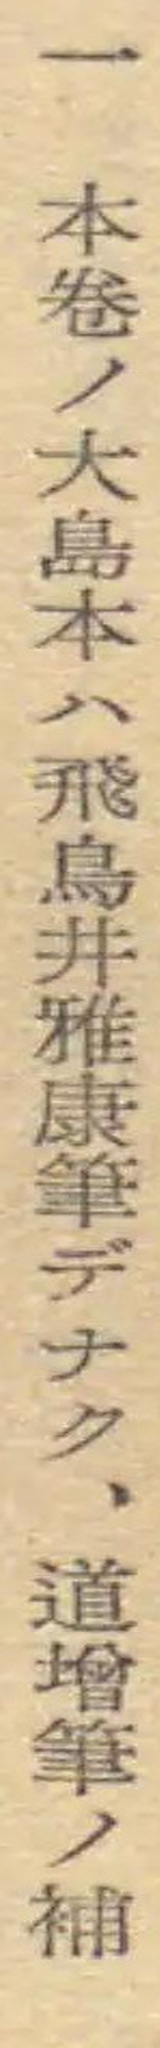一本巻ノ大島本ハ飛鳥井雅康筆デナク、道増筆ノ補
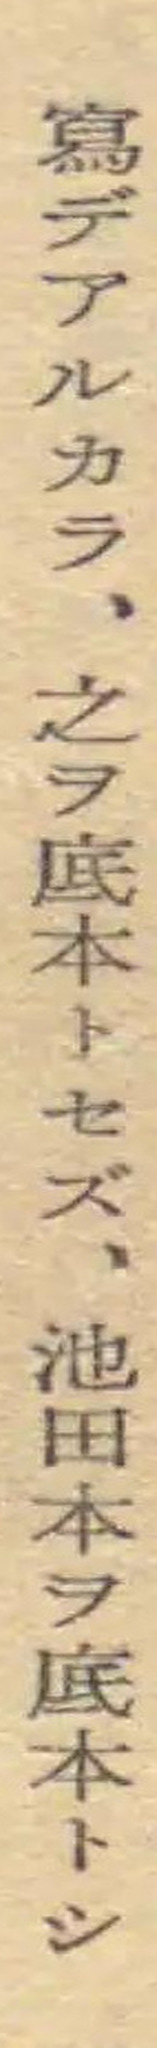写デアルカラ、之ヲ底本トセズ、池田本ヲ底本トシ
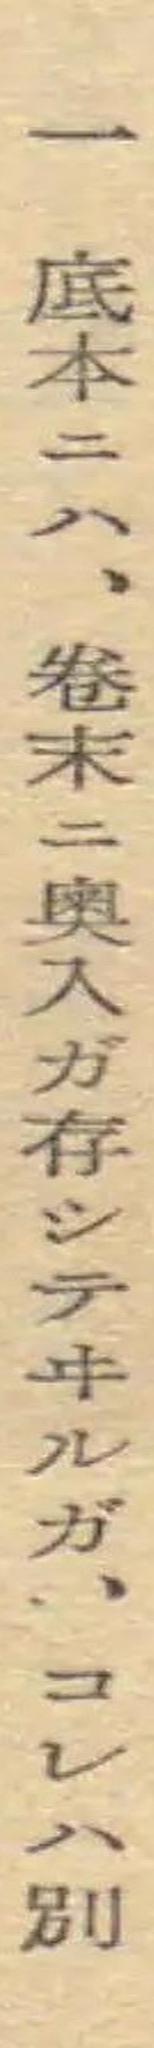一底本ニハ、巻末ニ奥入ガ存シテヰルガ、コレハ別
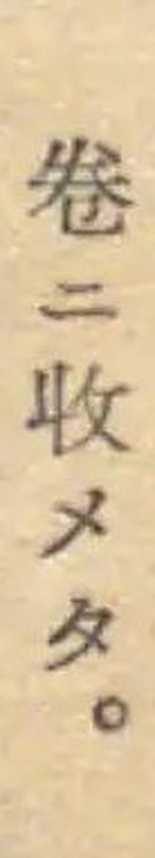巻ニ収メタ。
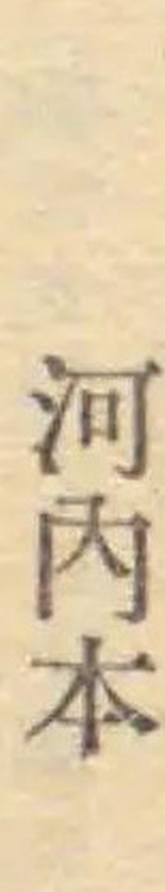河内本
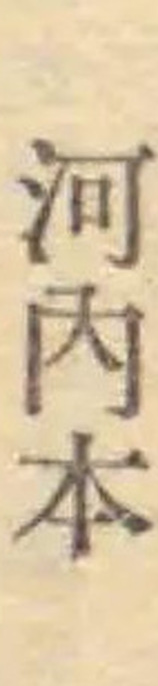河内本

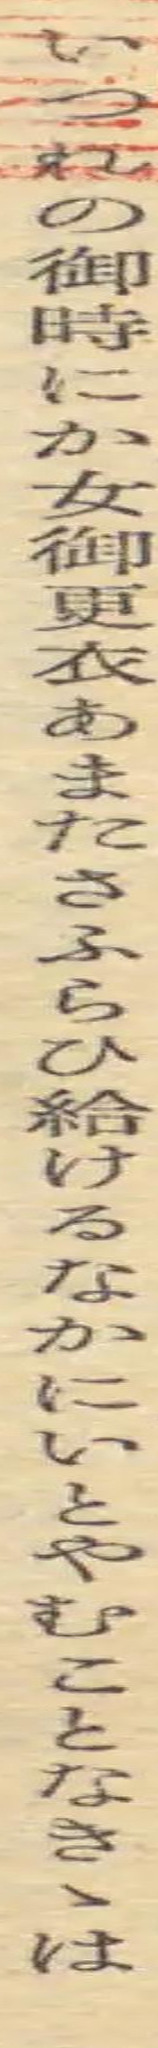いつれの御時にか女御更衣あまたさふらひ給けるなかにいとやむことなきゝは
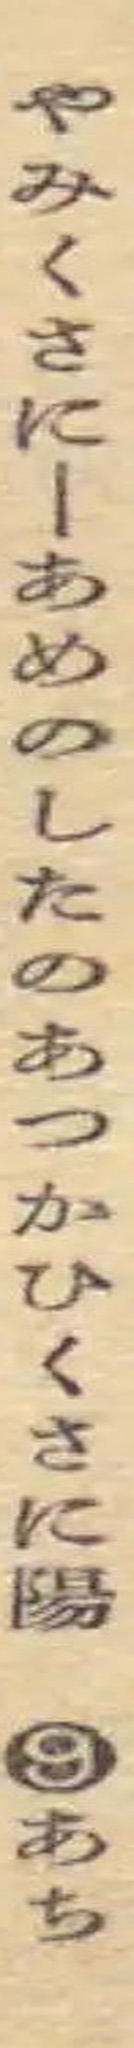やみくさに―あめのしたのあつかひくさに陽❾あち
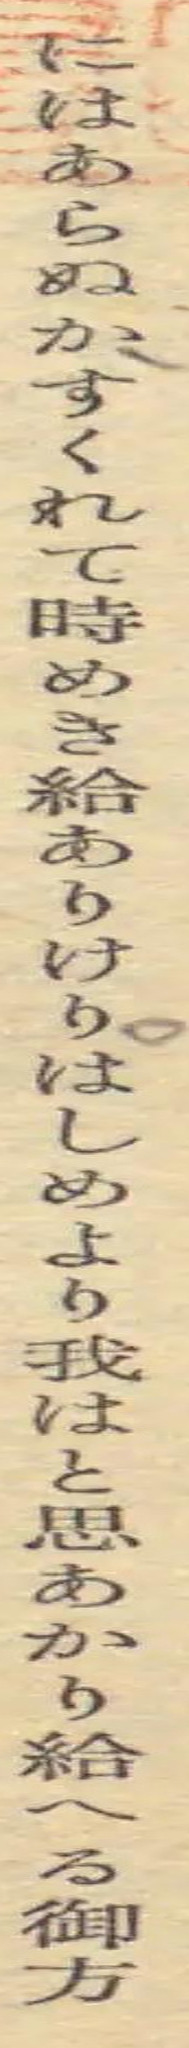にはあらぬかすくれて時めき給ありけりはしめより我はと思あかり給へる御方
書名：校異源氏物語.
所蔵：国立国会図書館 National Diet Library, JAPAN
